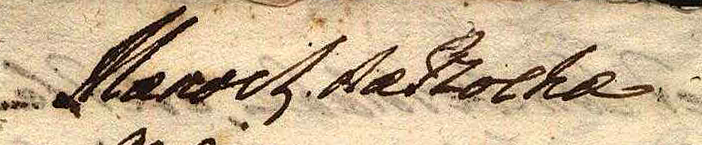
ManoeL da Rocha
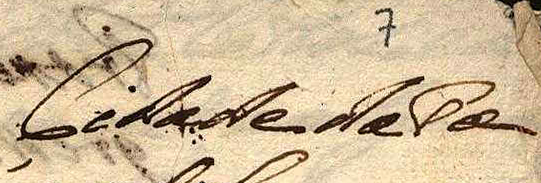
Cidade da Pa
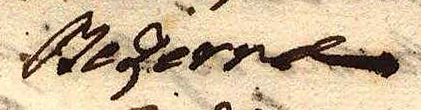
Bezerra
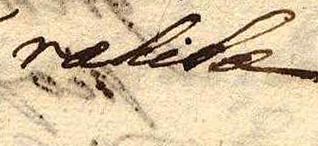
rahiba
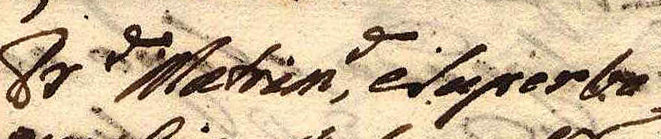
Pro Matrimo, e Superve
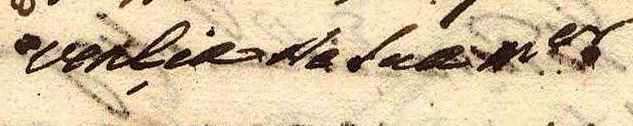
venÇia da sua mer
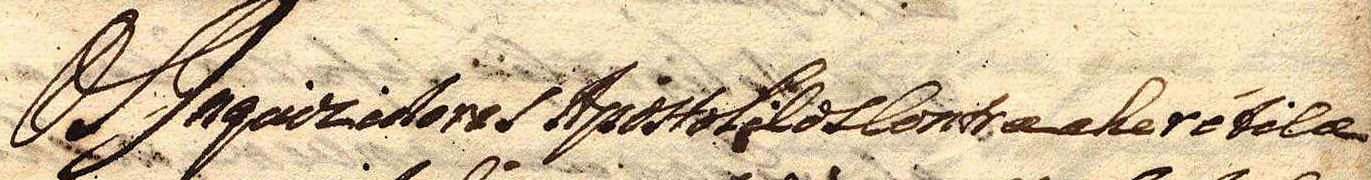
Os Jnquizidores ApostoLicoz Contra a herétiCa
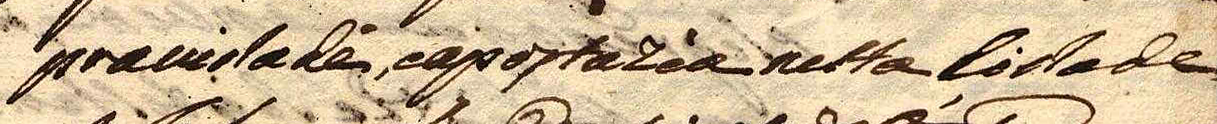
pravidade e apostazia nesta Çidade
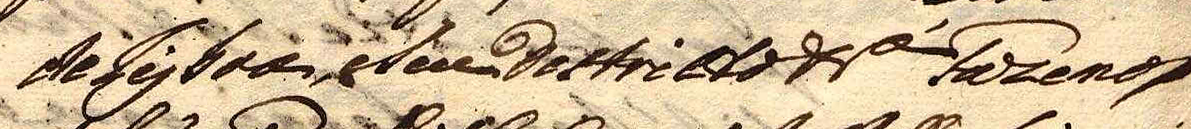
de Lisboa, e seu destricto &ra Fazemos
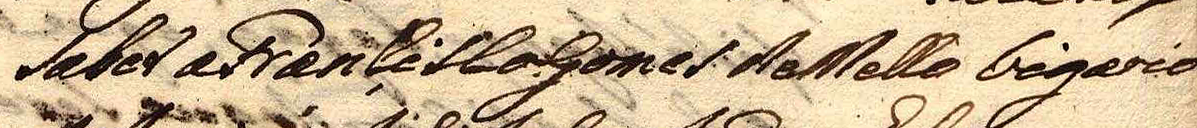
saber a FranÇisCo Gomes de Mello Vigario
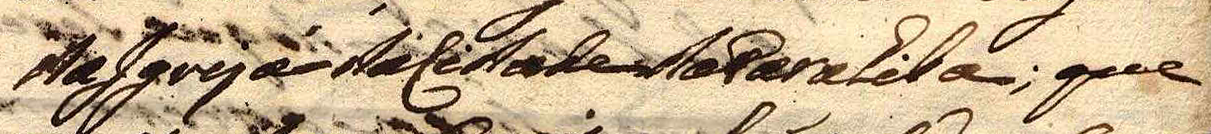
da Jgreja da Cidade da Parahiba; que
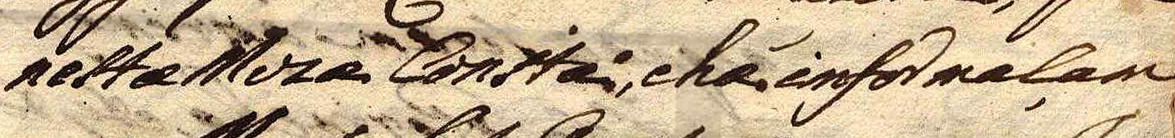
nesta Meza Consta, e há informaÇam
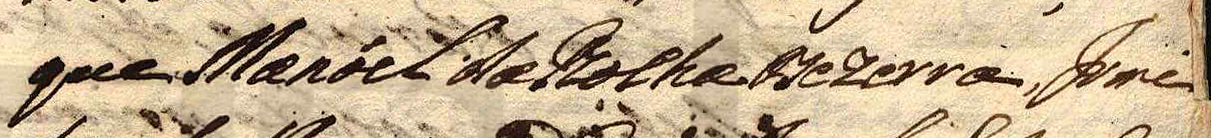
que Manóel da Rocha Bezerra Jrmi
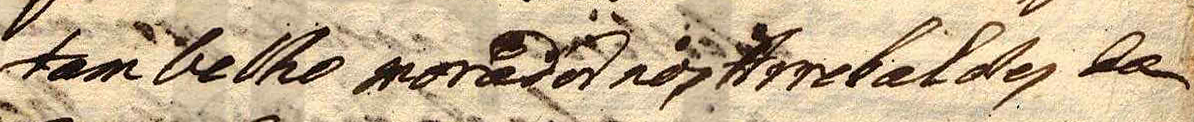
tam velho morador nos Arrebaldes da
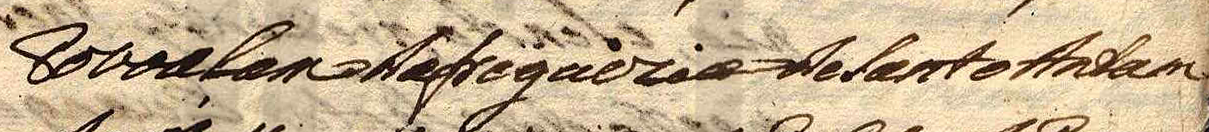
PouoaÇam da freguezia de Santo Antam
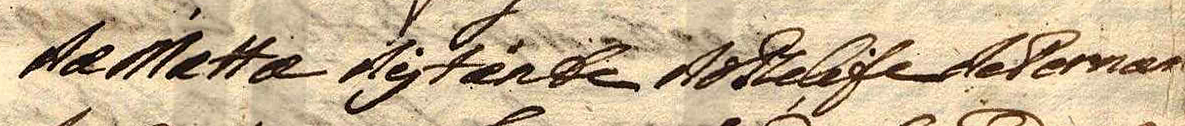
da Matta distante do ReÇife de Pernan
